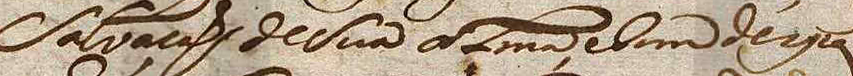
Salvaçaõ de sua alma, e bom despa
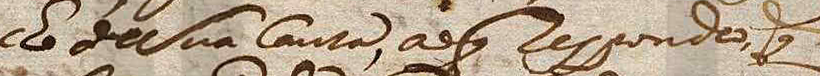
cho de Sua Cauza, ao q̄ Respondeo, q̄
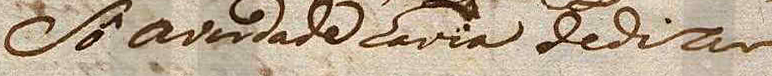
Sô a verdade havia de dizer
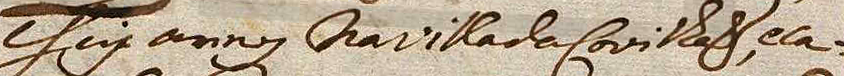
e seis annos na villa da Covilhã, e ca
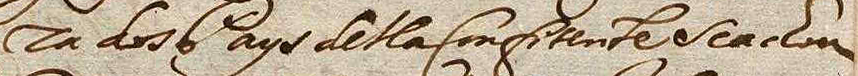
za dos Pays della Confitente se achou
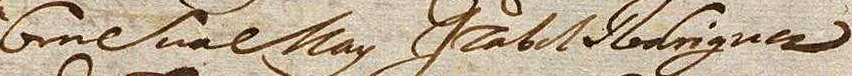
Com Sua May Jzabel Rodriguez
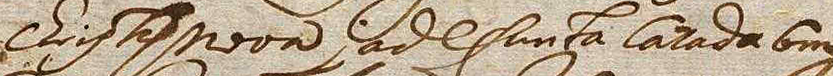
christã nova ja defunta cazada com
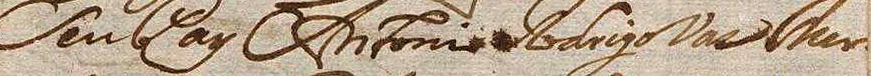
Seu Pay Antonio Rodrigo Vaz Mer
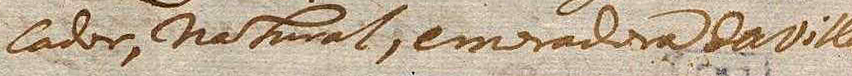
cador, natural, e moradora da villa
